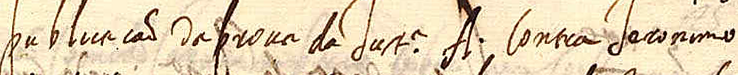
publicacaõ da proua da Just.a A. contra Jeronimo
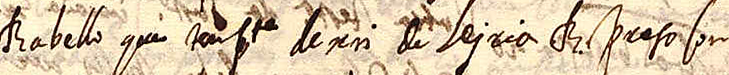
Rabello que ten pte de xn de Lejria R. preso Con
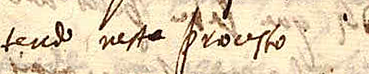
teudo neste processo
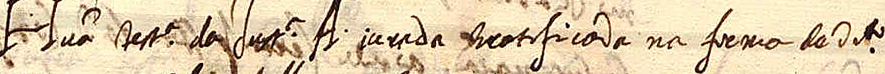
Huā testa. da Justa. A. iurada E rateficada na forma de drto.
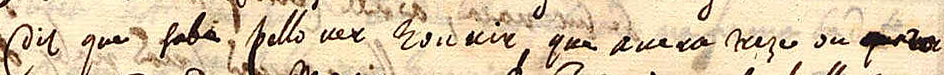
diz que sabe pello uer E ouuir que auera treze ou quator
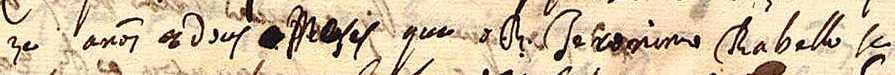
ze anōs E dous _Meses que o R. Jeronimo Rabello se
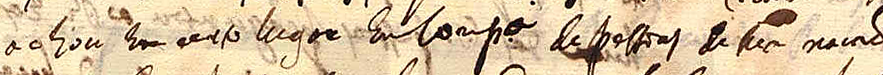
achou Em certo lugar En Comp.a de pessoas de sua nacaõ
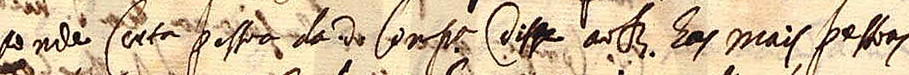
aonde Certa pessoa da .d. Conp.a disse ao R. E as mais pessoas
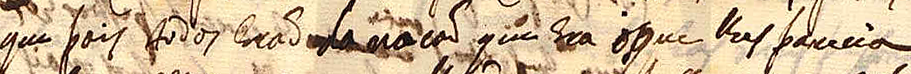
que pois todos Eraõ da nacaõ que Era o que lhes parecia
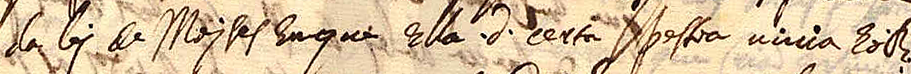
da lej de Mojses En que Ella .d. certa pessoa uiuia E o R.
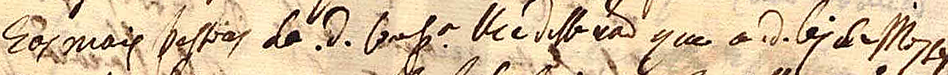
E as mais pessoas da .d. Conp.a lhe disseraõ que a .d. lej de Mojses
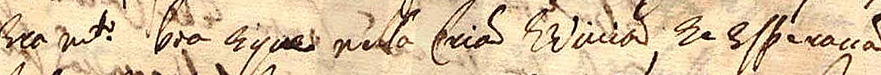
Era mto. boa E que nella Criaõ E Viuiaõ Ee Esperauaõ
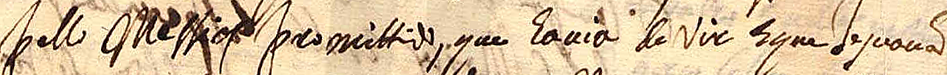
pello Messias promittido, que hauia de vir E que Jejuauaõ
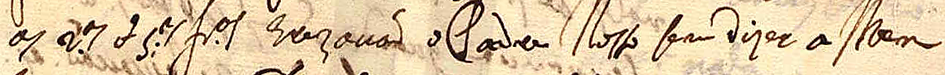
as 2.as e 5.as fr.as E rezauaõ o Padre Nosso sem dizer aMen
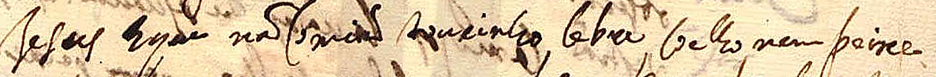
Jesus E que naõ Comiaõ toucinho, lebre, Coelho, nem peixe
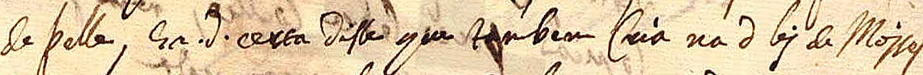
de pelle, E a .d. certa disse que tambem Cria na d lej de Mojses
